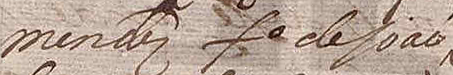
mend̄ez fo de João
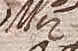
Miz̄
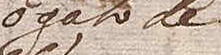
o gato de
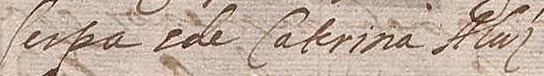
Serpa E de Caterina Aluz̄
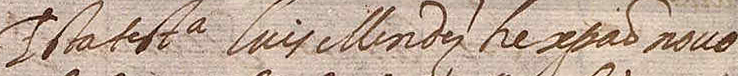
Esta testa luis Mendez̄ he xpaõ nouo
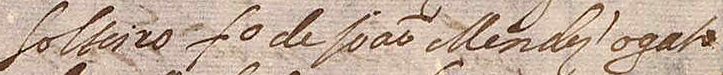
solteiro fo de Joaõ Mendez̄ o gato
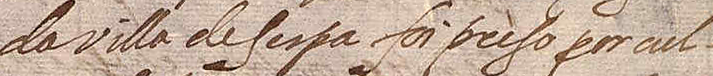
da villa de Serpa foi preso por cul
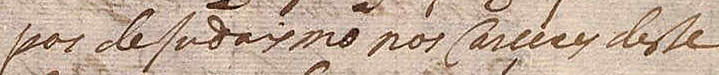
pas de Judaismo nos Carçeres deste
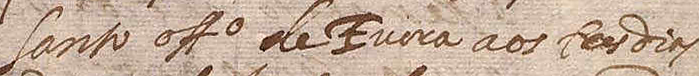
Santo offo de Euora aos tres dias
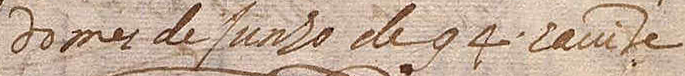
do mes de Junho de 94. E a uīte
